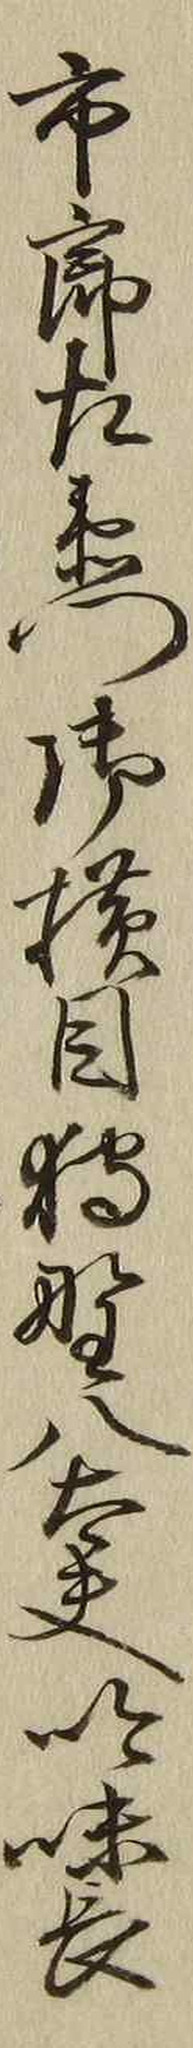市郎左衛門御横目狩野八太夫吟味長
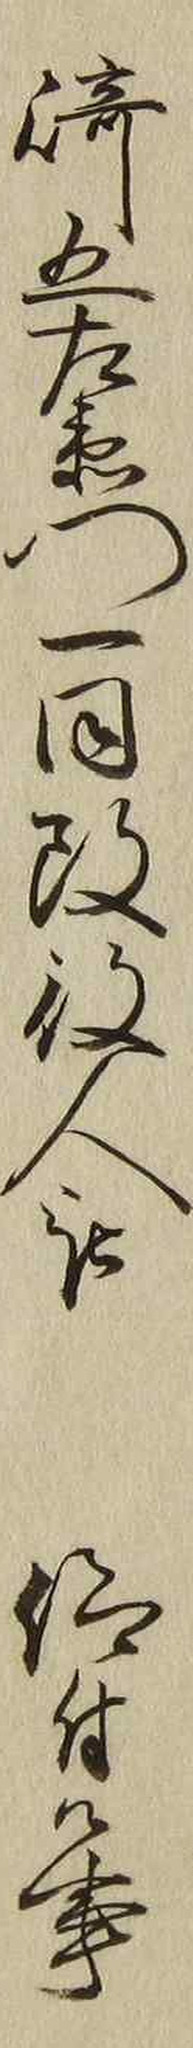崎五左衛門一同改役人被仰付候事
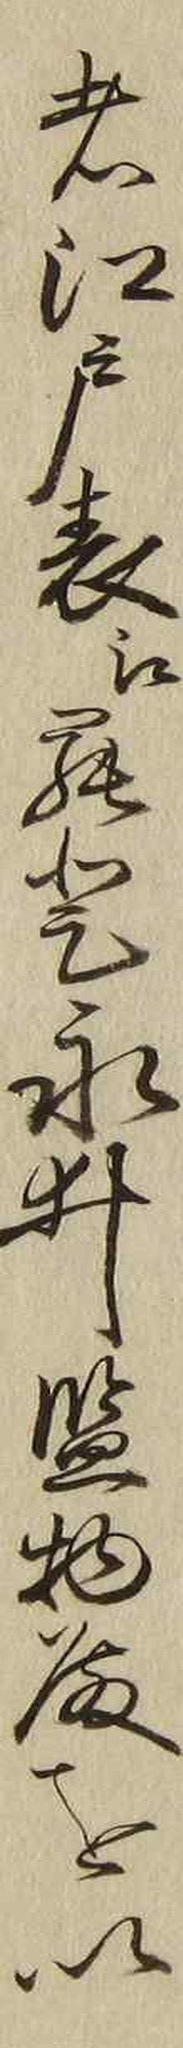者江戸表江罷登永井監物殿を以
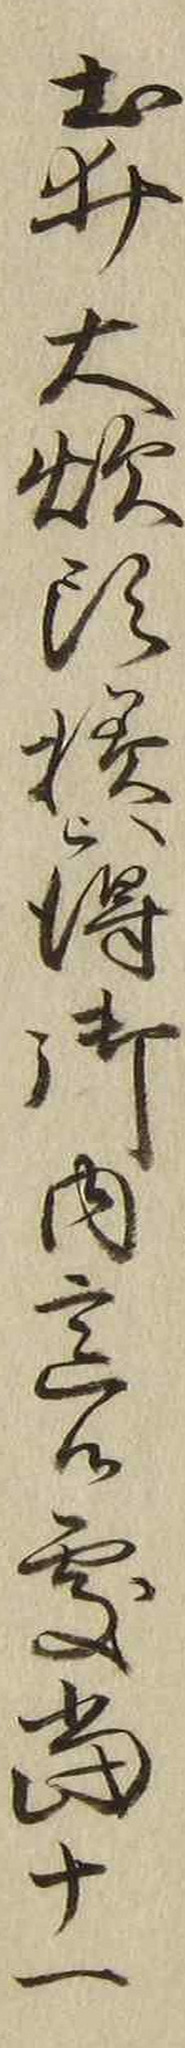土井大炊頭様へ被得御内意候処当十一
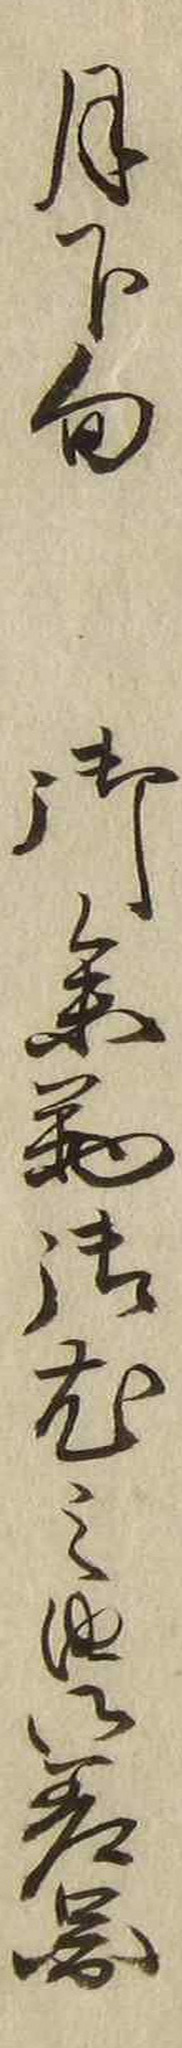月下向御参勤御尤之由御差図

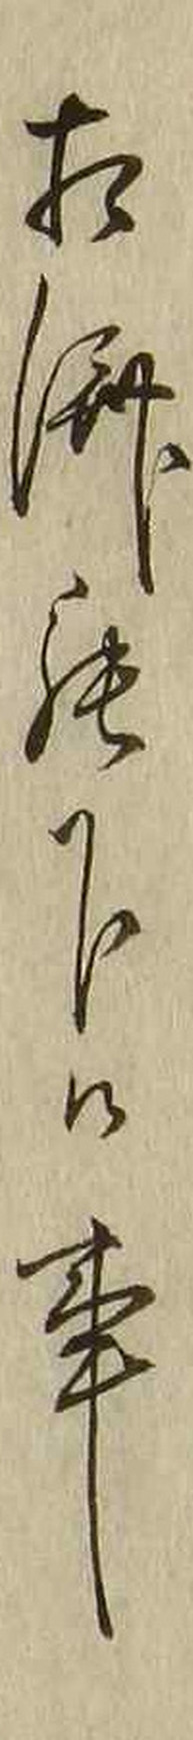相済罷下候事
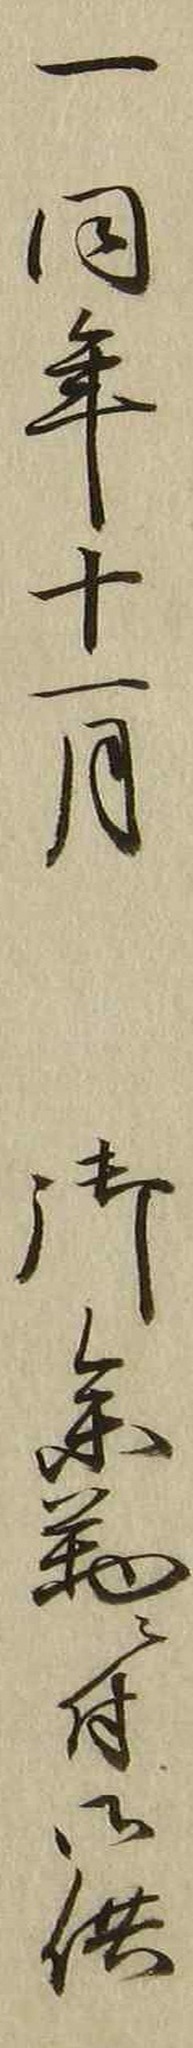一同年十一月御参勤ニ付御供
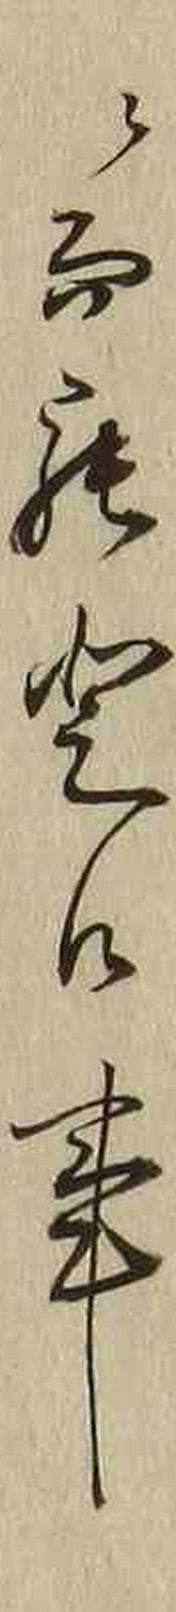ニ而罷登候事
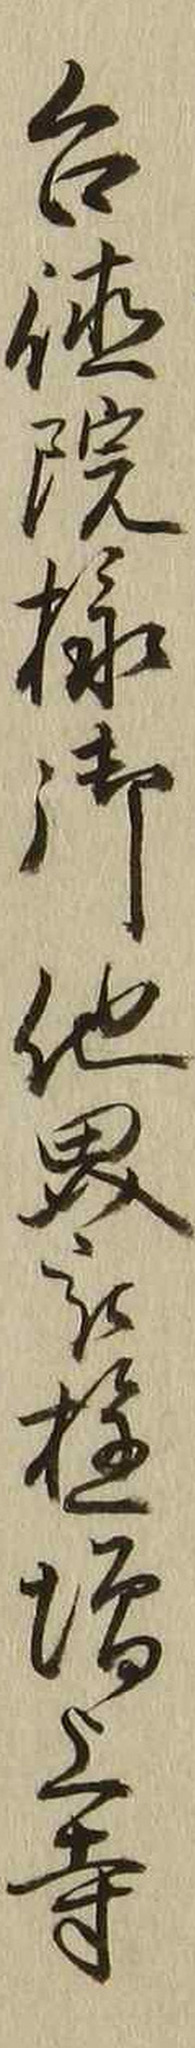台徳院様御他界被遊増上寺
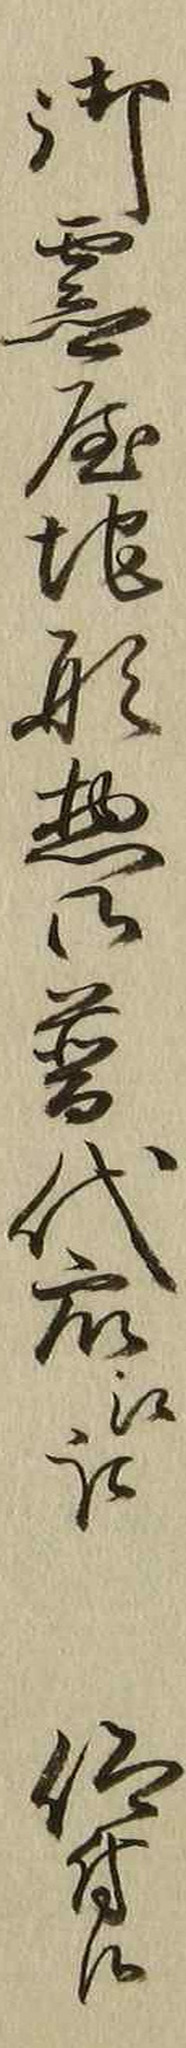御霊屋地形惣御譜代衆江被仰付候
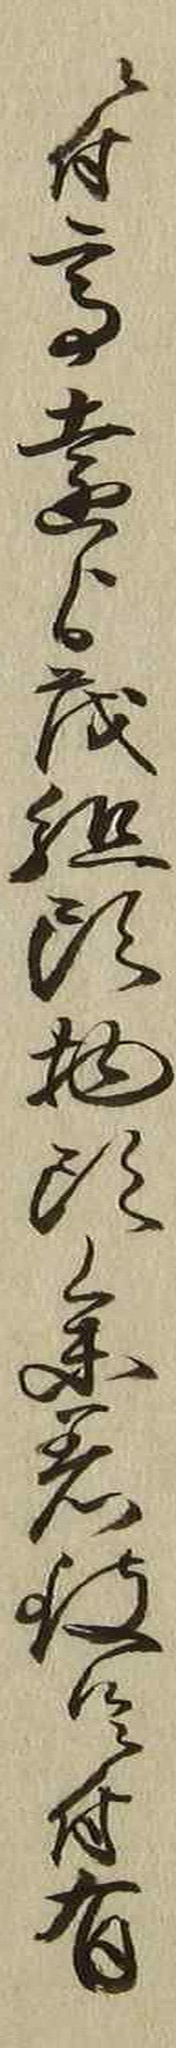ニ付高遠ゟも組頭物頭参着致候ニ付有
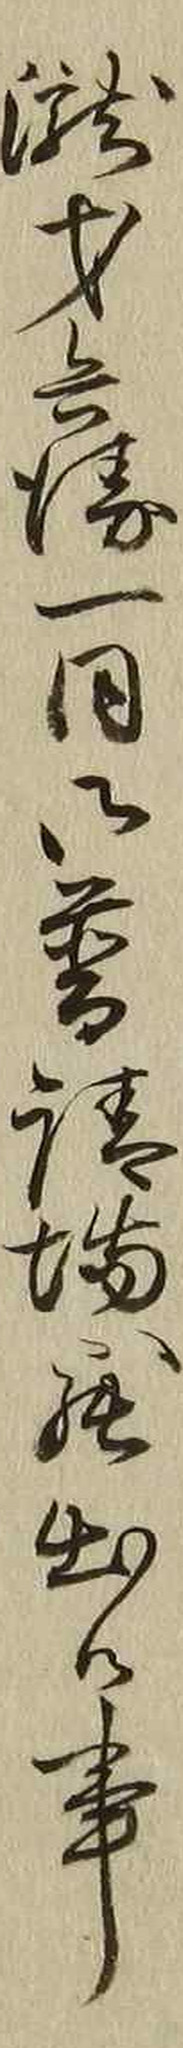瀧才兵衛一同御普請場へ罷出候事
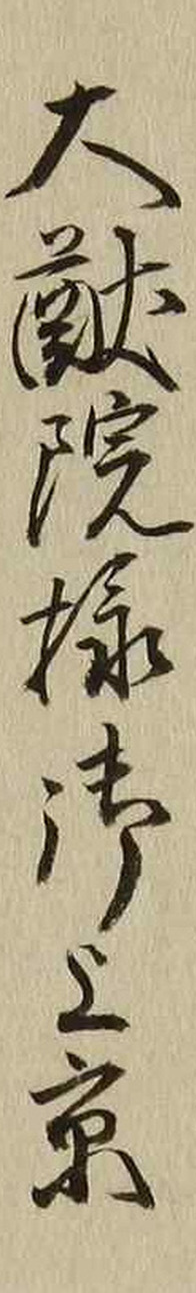大猷院様御上京
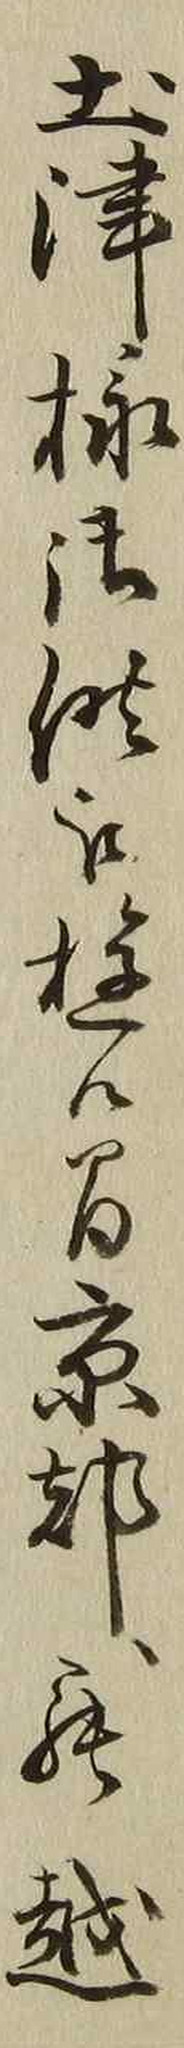土津様御供被遊候間京都へ罷越
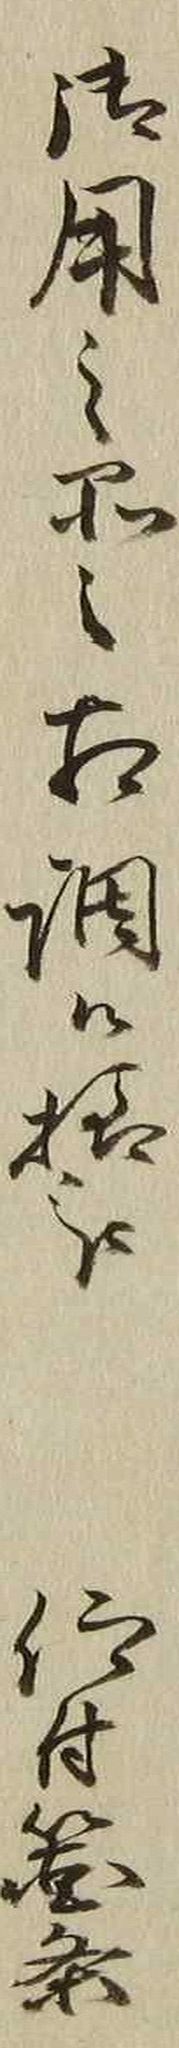御用之品々相調候様被仰付箇条
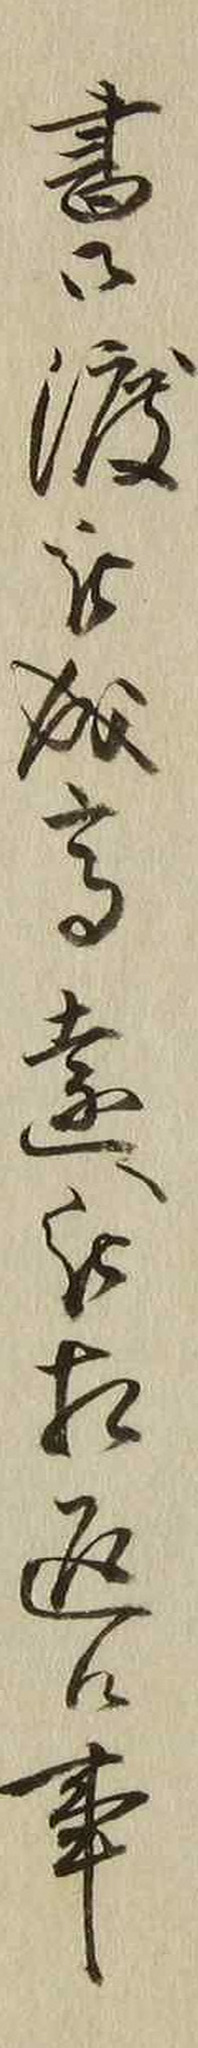書御渡被成高遠へ被相返候事
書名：諸士系譜　巻之60　と之部3
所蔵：会津若松市立会津図書館
